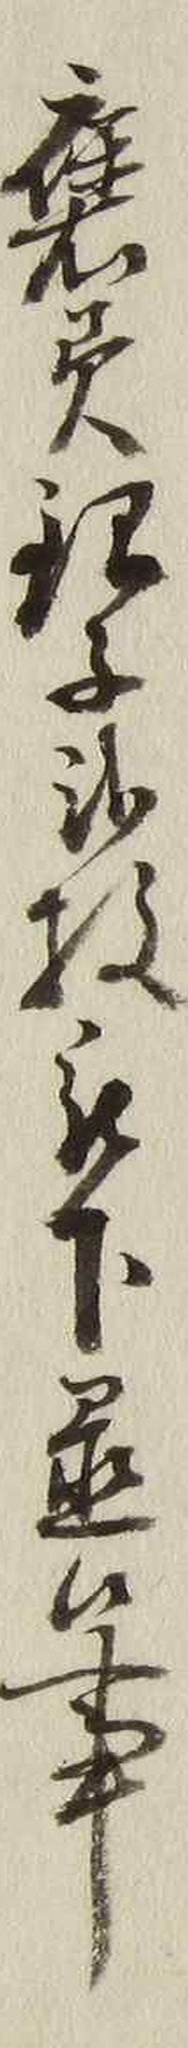褒美銀子弐枚被下置候事
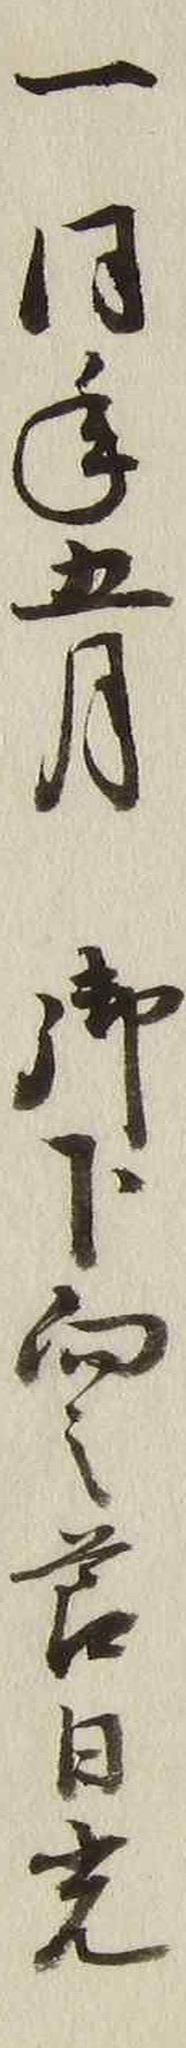一同年五月御下向之節日光
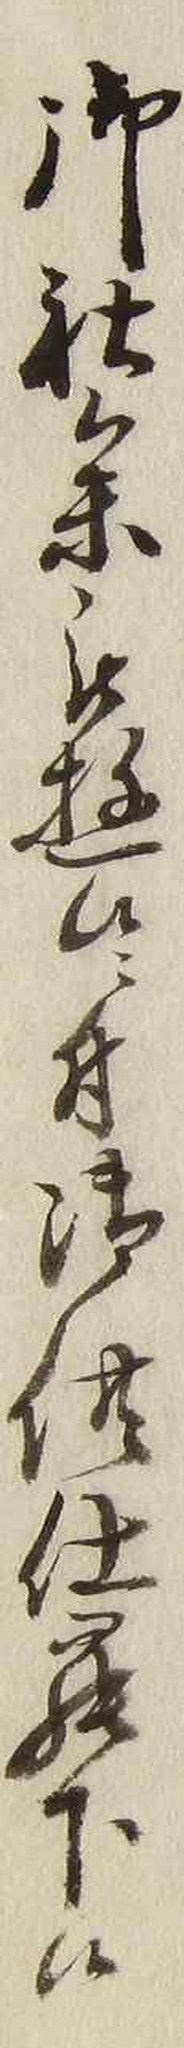御社参被遊候ニ付御供仕罷下候
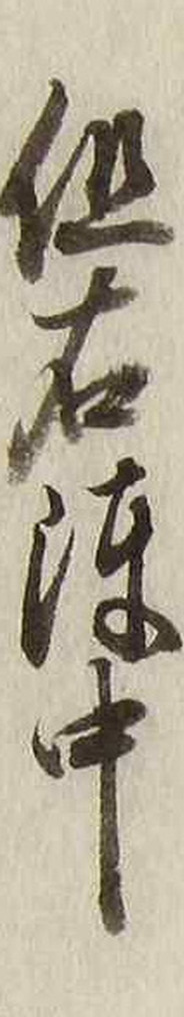但右陣中
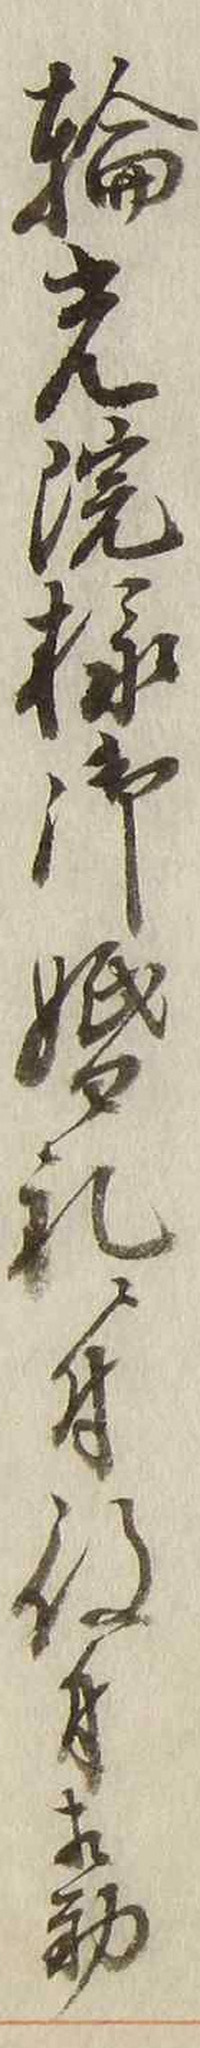輪光院様御婚礼ニ付役付相勤

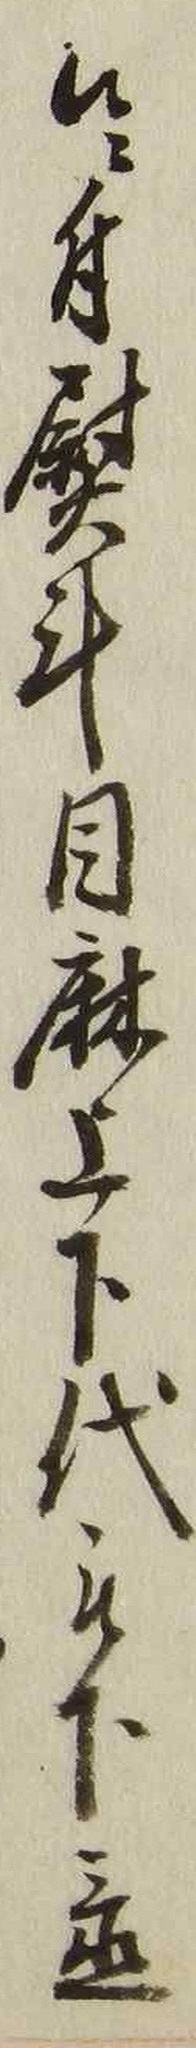候ニ付熨斗目麻上下代被下置
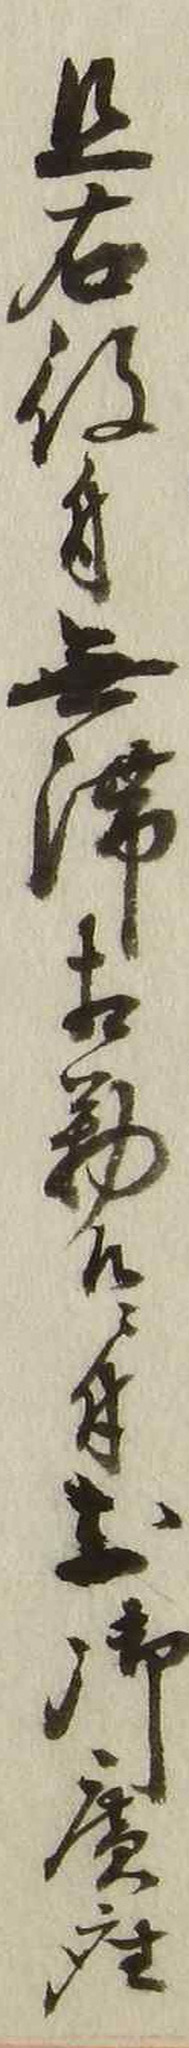且右役付無滞相勤候ニ付於御広座
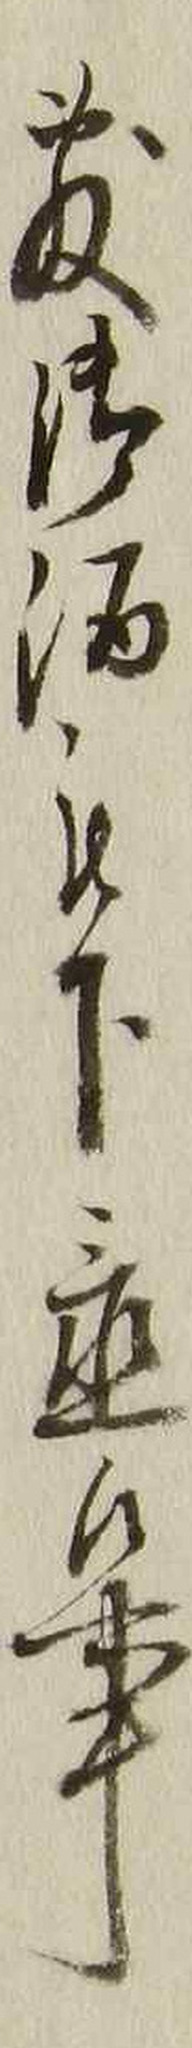敷御酒被下置候事
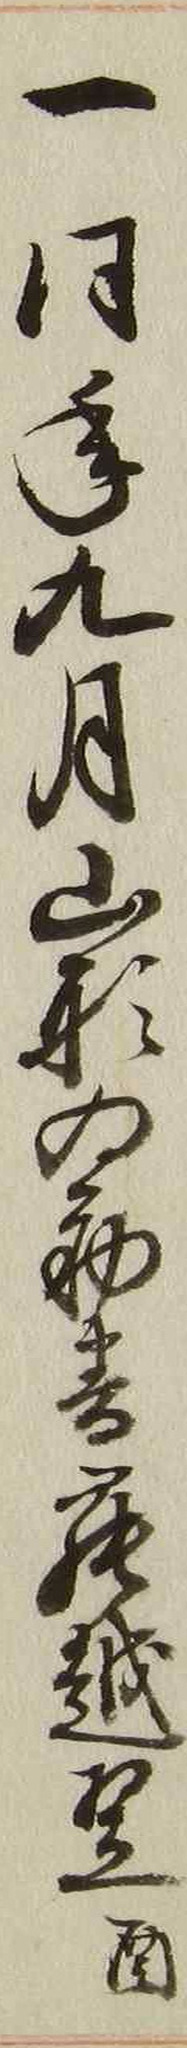一同年九月山形為勤番罷越翌酉
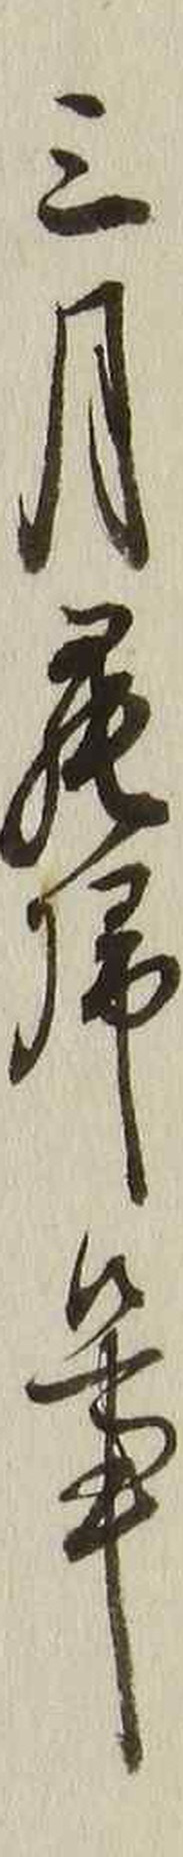三月罷帰候事
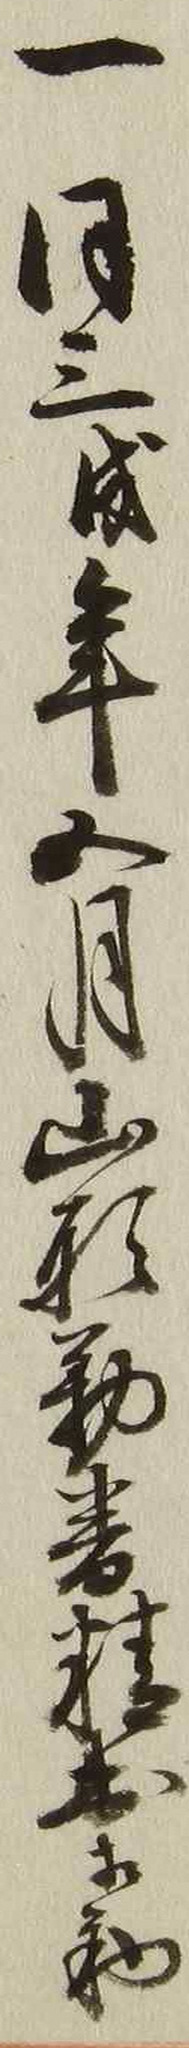一同三戌年五月山形勤番精出相勤
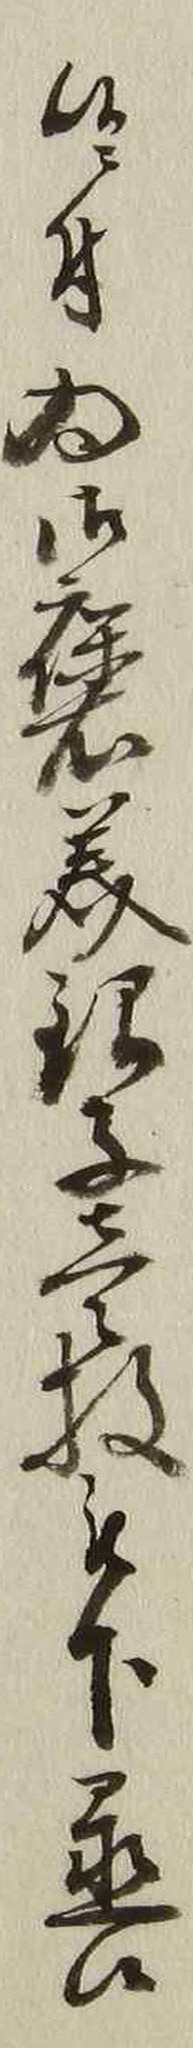候ニ付為御褒美銀子壱枚被下置候
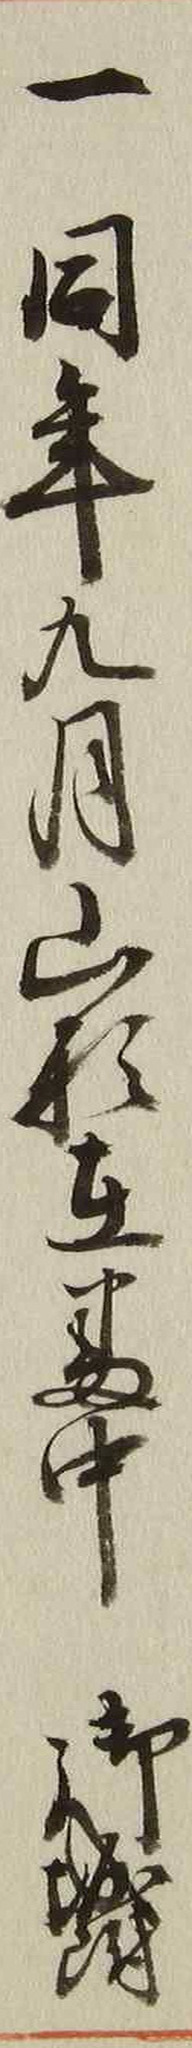一同年九月山形在番中御城附
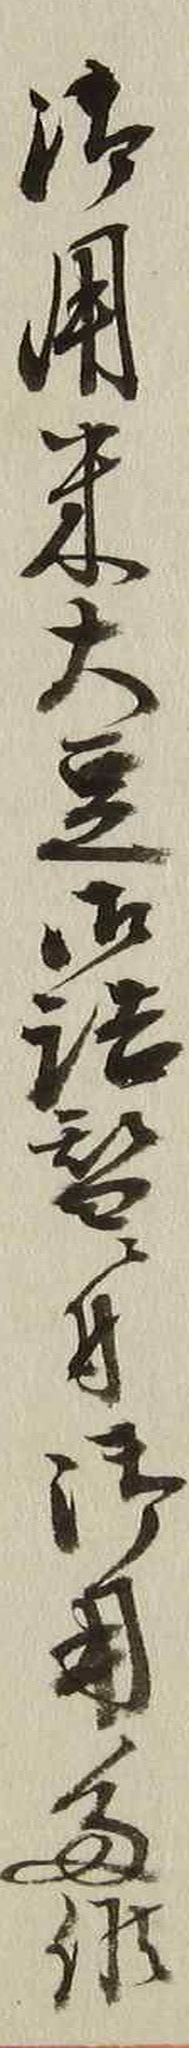御用米大豆御詰替ニ付御用多候
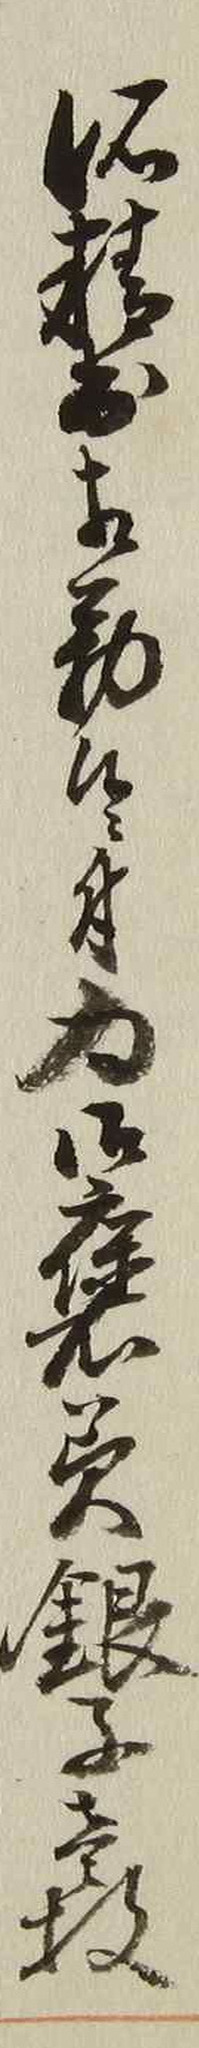所精出相勤候ニ付為御褒美銀子壱枚
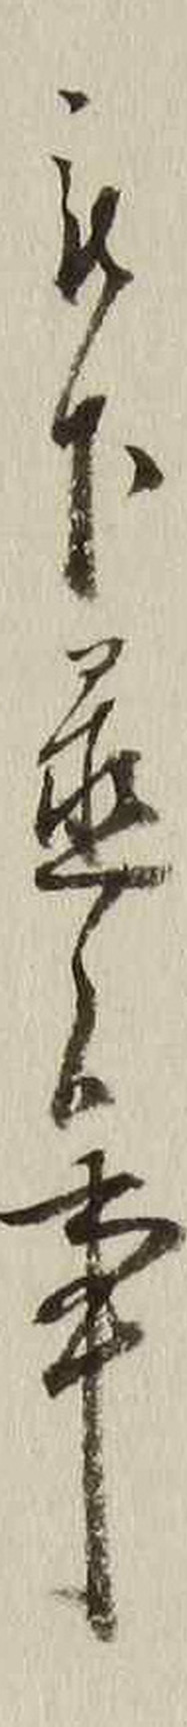被下置候事
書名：諸士系譜　巻之27　い之部27
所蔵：会津若松市立会津図書館
